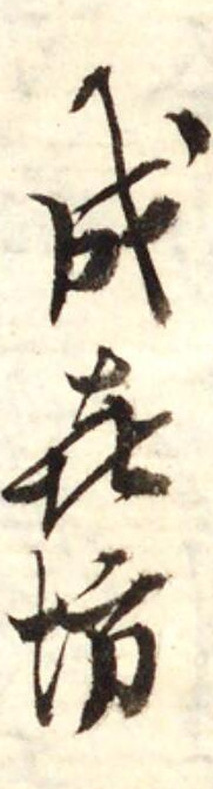成森坊
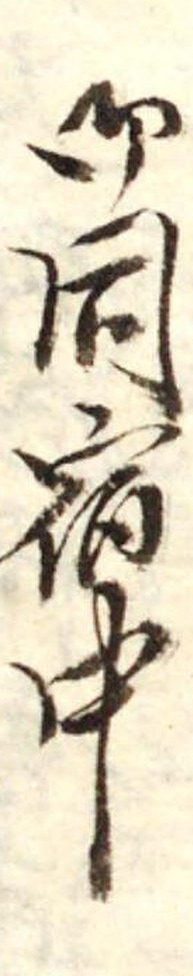御同宿中
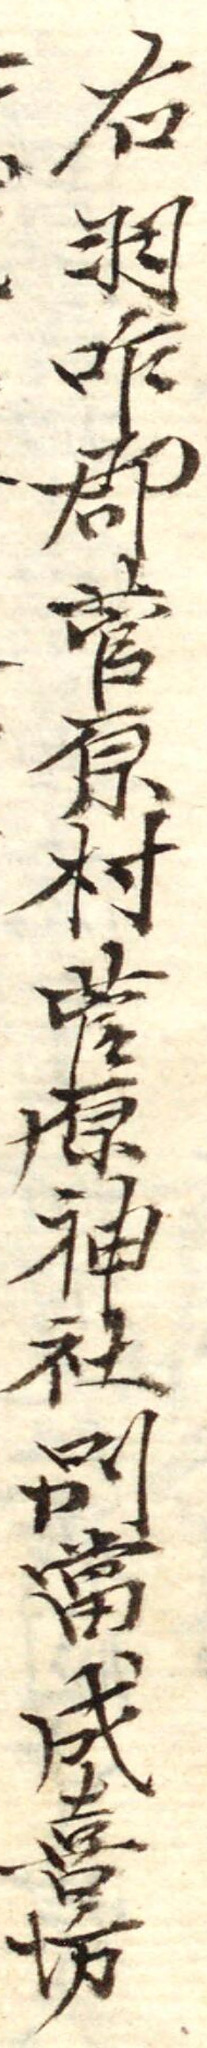右羽咋郡菅原村菅原神社別当成喜坊
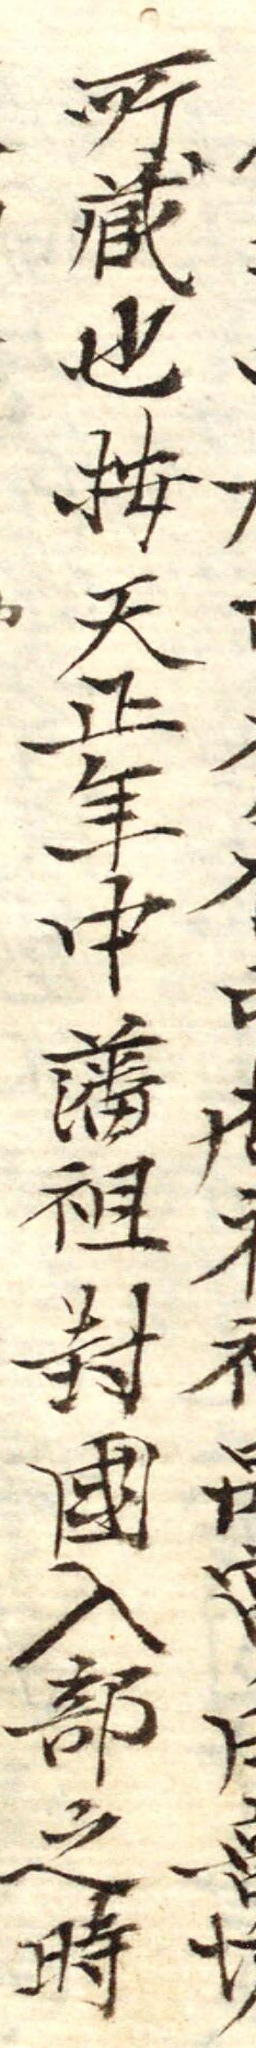所蔵也按天正年中藩祖封国入部之時

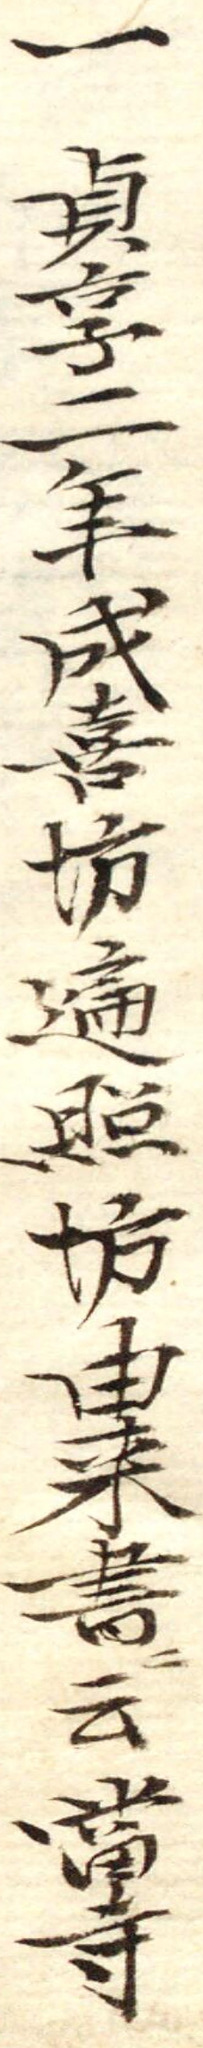一貞享二年成喜坊遍照坊由来書に云当寺
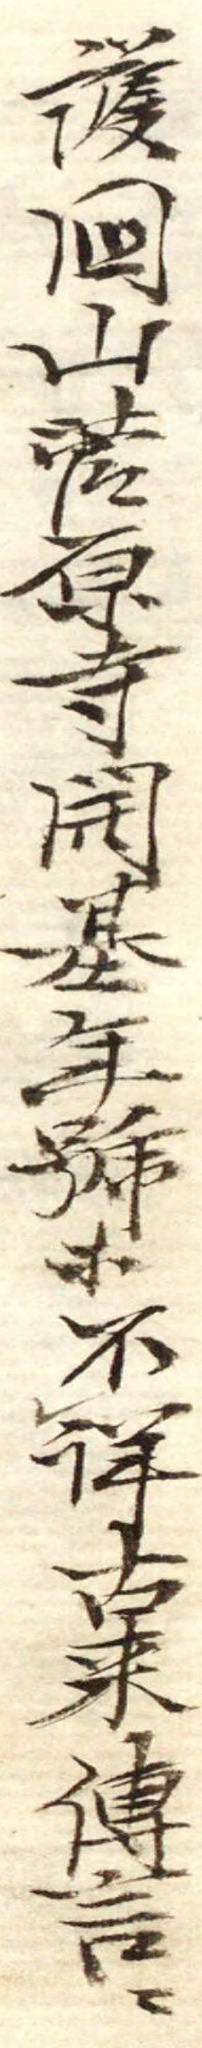護国山菅原寺開基年号等不詳古来伝言に
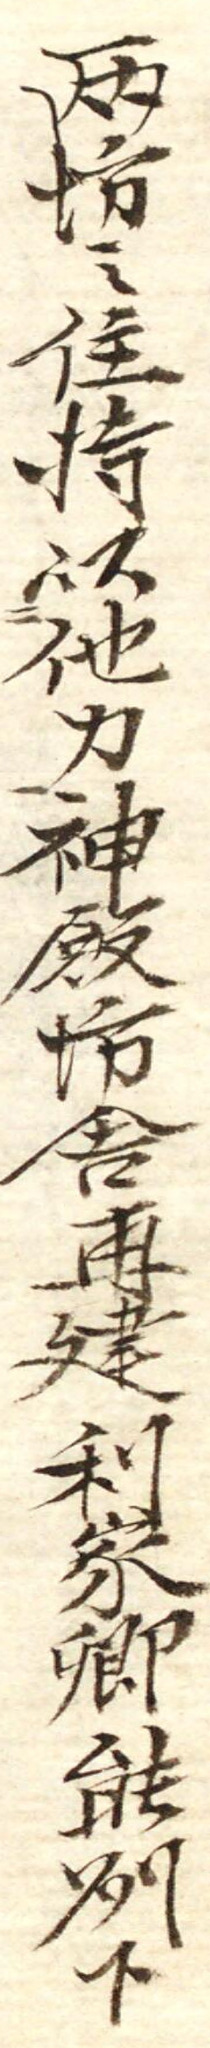両坊之住持以他力神殿坊舎再建利家卿能州下
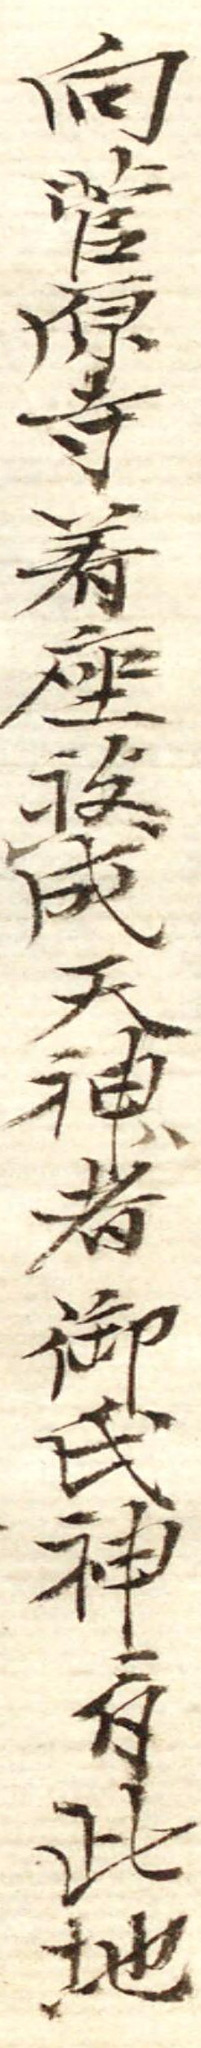向菅原寺着座被成天神者御氏神に付此地
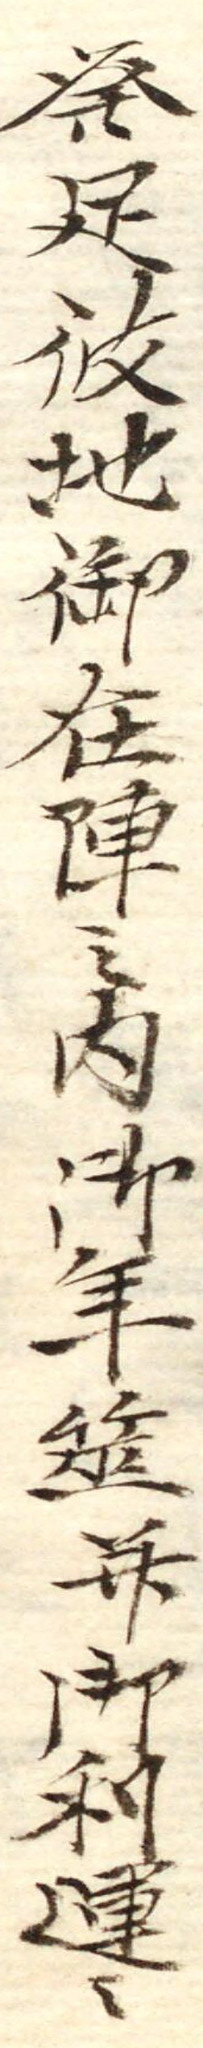発足彼地御在陣之内御年筮幷御利運之
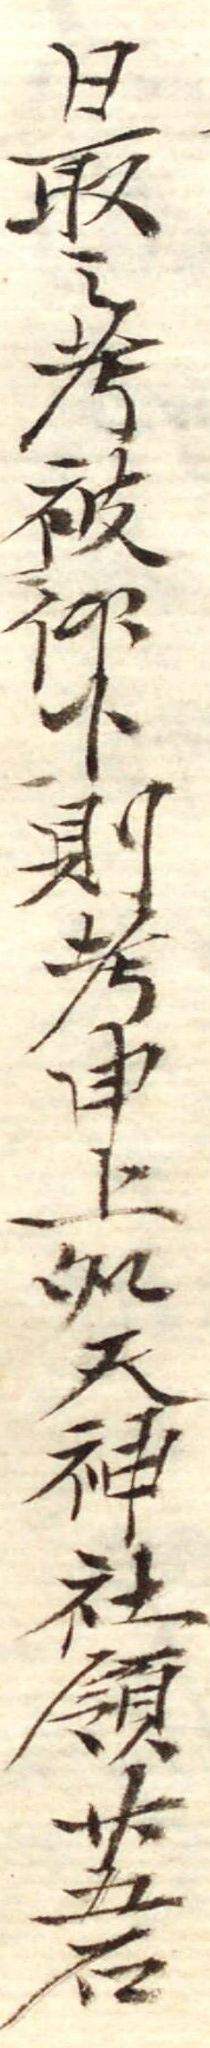日取之考被仰下則考申上処天神社領廿五石
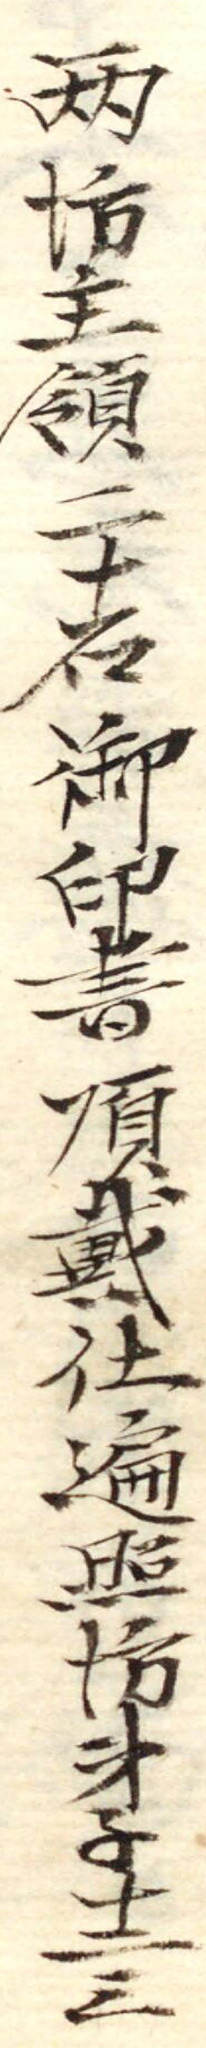両坊主領二十石御印書頂戴仕遍照坊弟子十二三
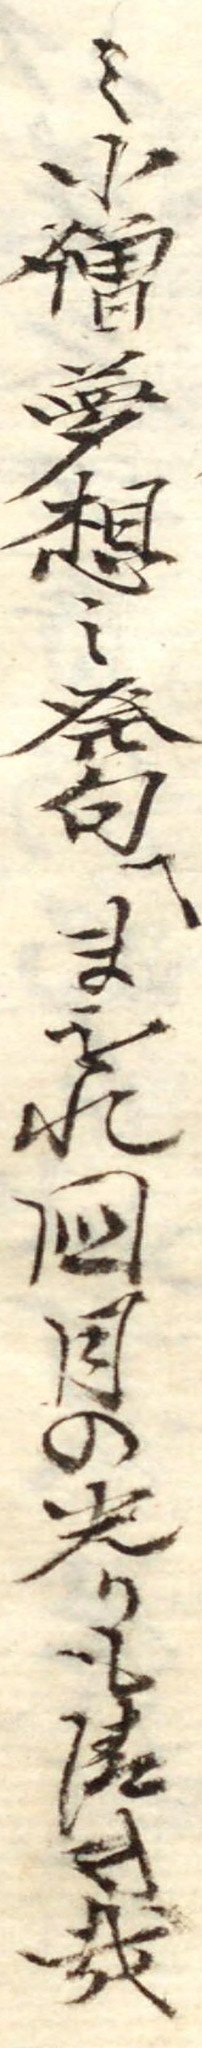之小僧夢想之発句へまもれ国月の光りも清き哉
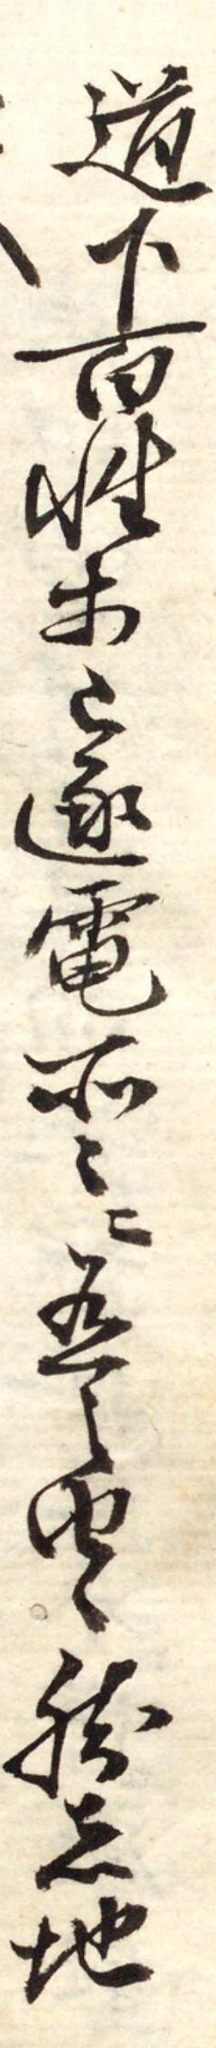道下百姓等之逐伝所々に有之由候然者地
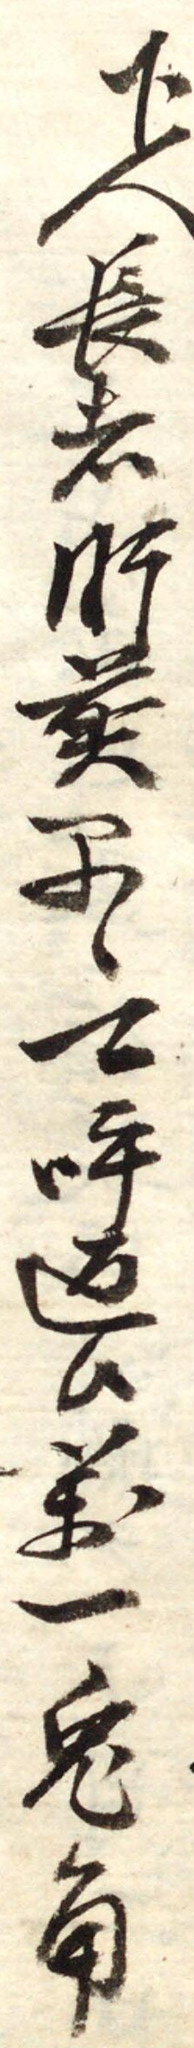下人長者肝煎早々可呼込候万一兎角
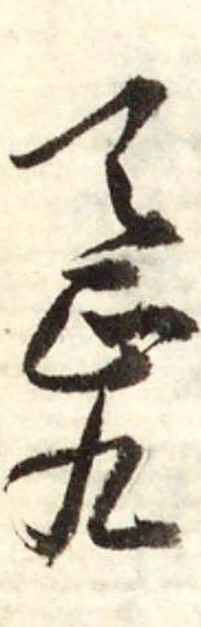天正九
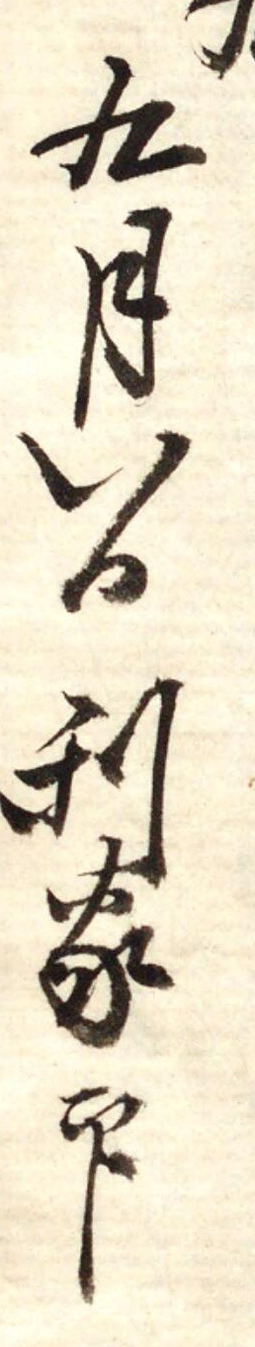九月八日利家印
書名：前田家封国証書集録
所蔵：Ishikawa Prefectural Library
